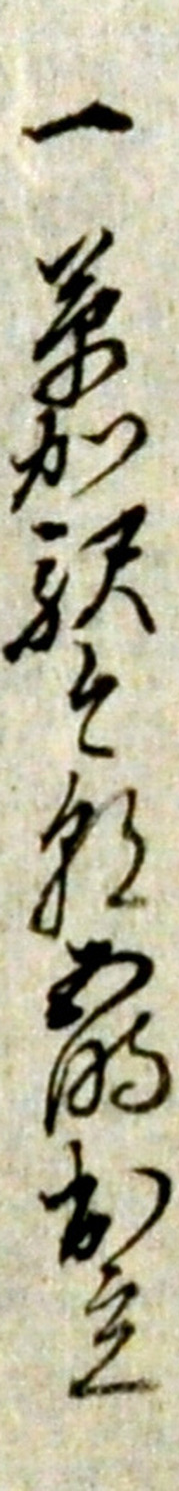一草加駅今朝五時出立
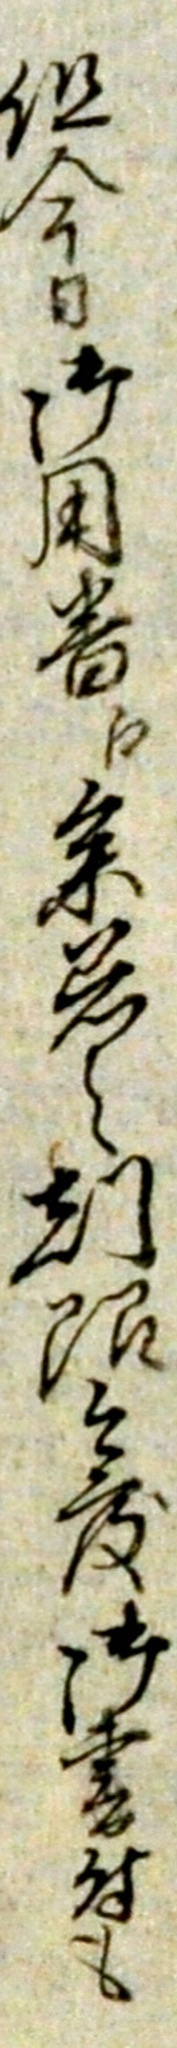但今日御用番江参着之刻限今度御書付も
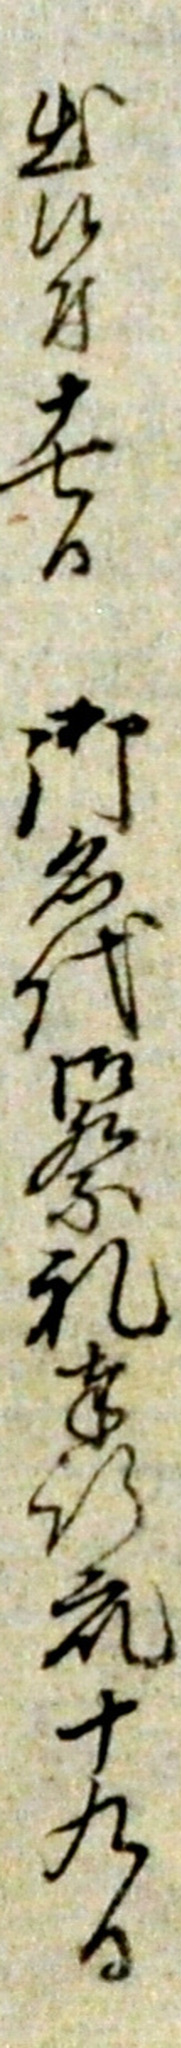出候付十七日御名代御祭礼奉行衆十九日
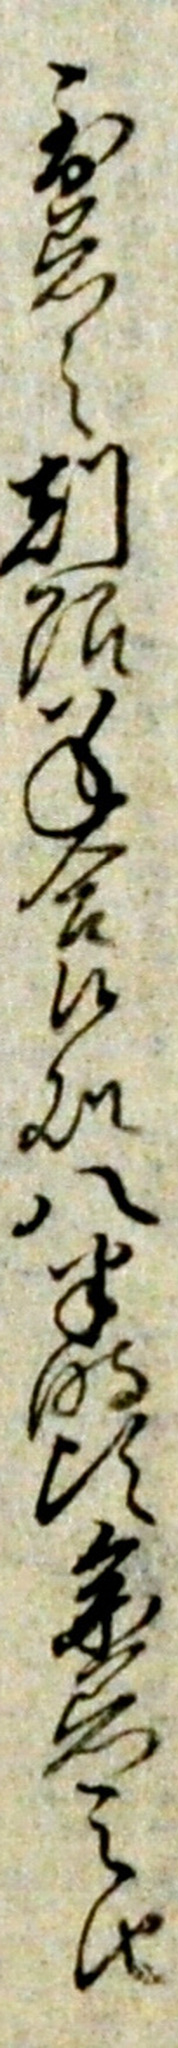到着之刻限承合候処八半時頃参着之由

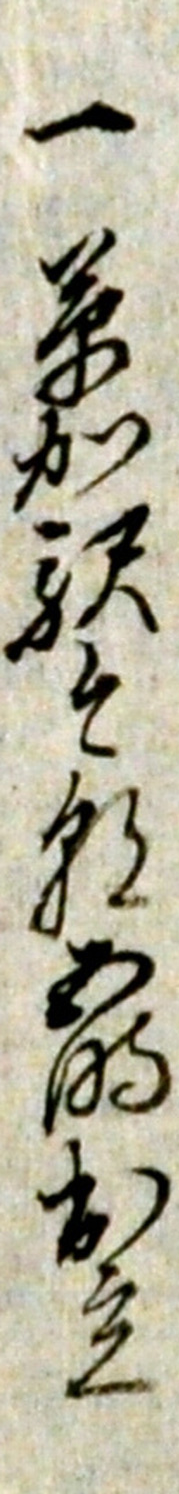一草加駅今朝五時出立
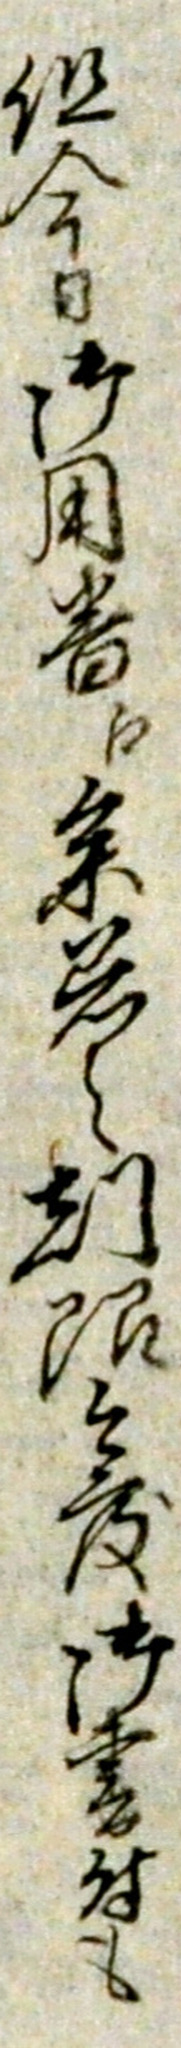但今日御用番江参着之刻限今御書付も
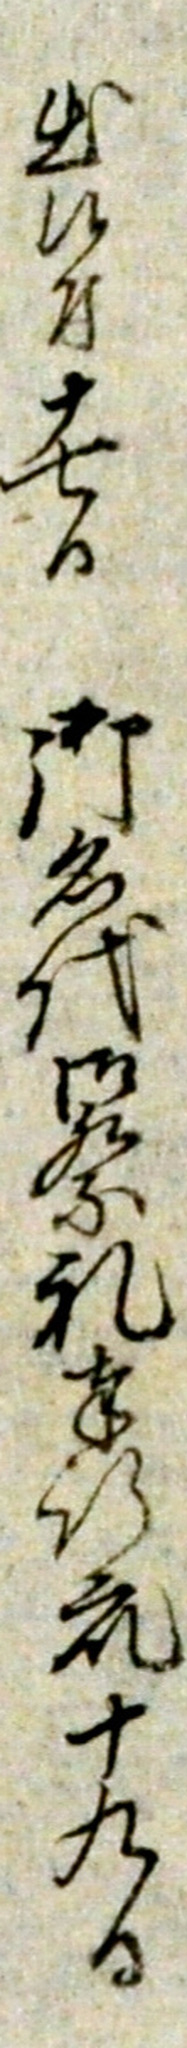出候付十七日御名代御祭礼奉行衆十九日
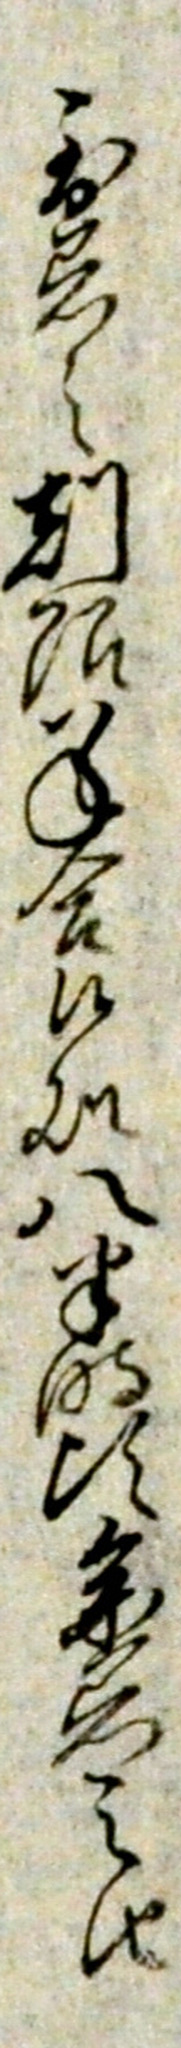ニ到着之刻限承合候処八半時頃参着之由
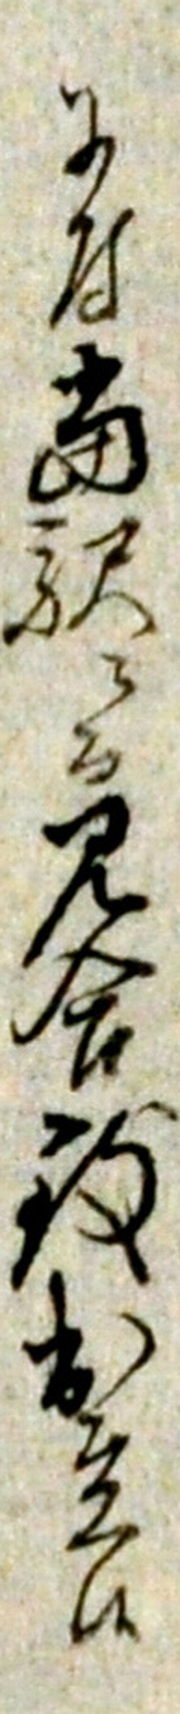ニ付当駅ニ而見合致出立候
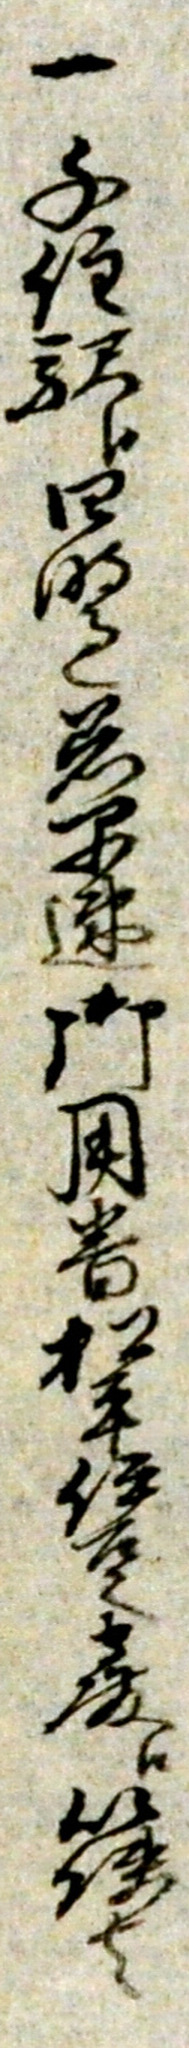一千住駅江四時過着早速御用番松平伊豆守殿江以使者
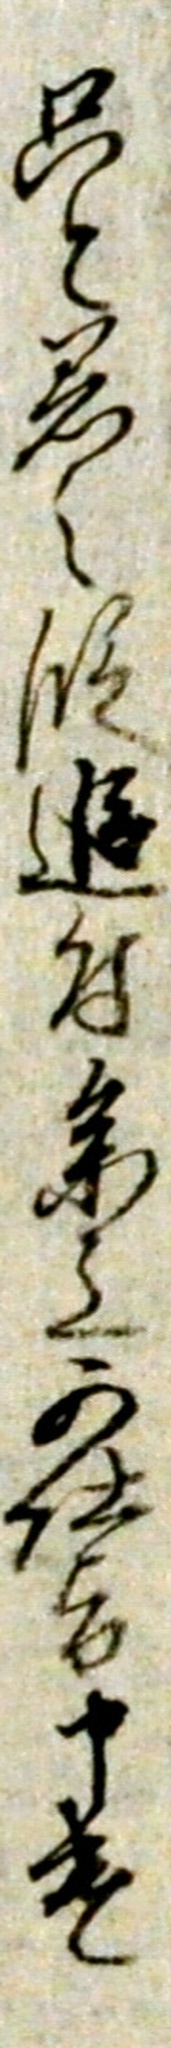只今着之段追付参上可仕旨申遣
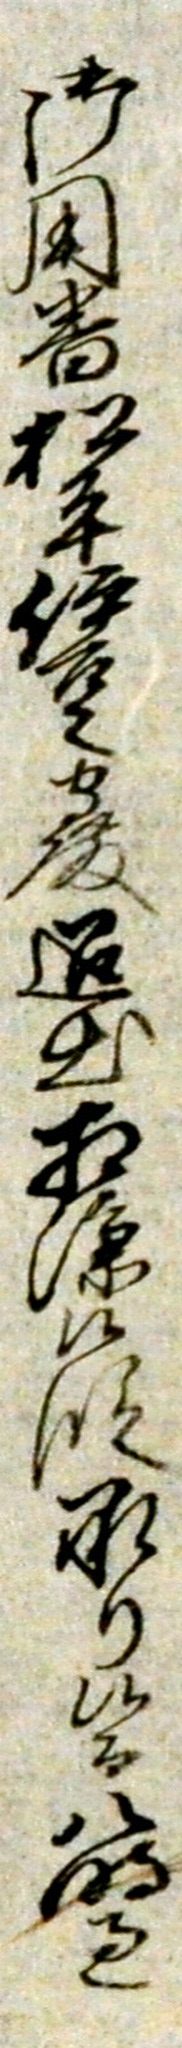御用番松平伊豆守殿退出相添候段承り候而八時過
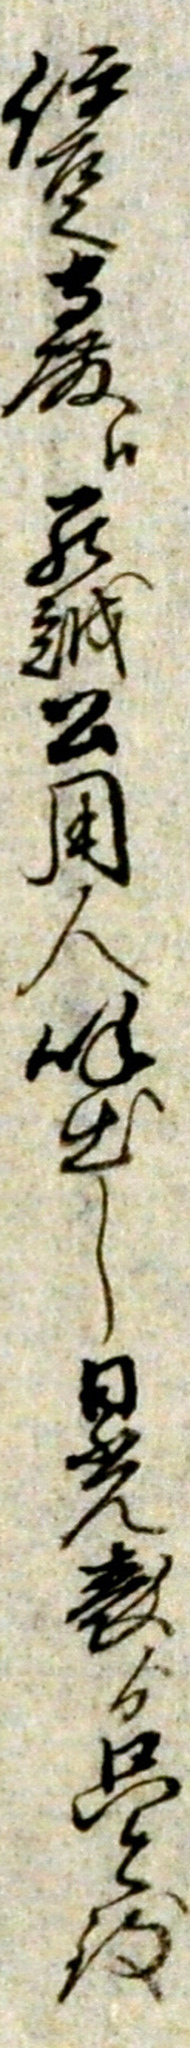伊豆守殿江罷越公用人呼出し日光表ゟ只今度
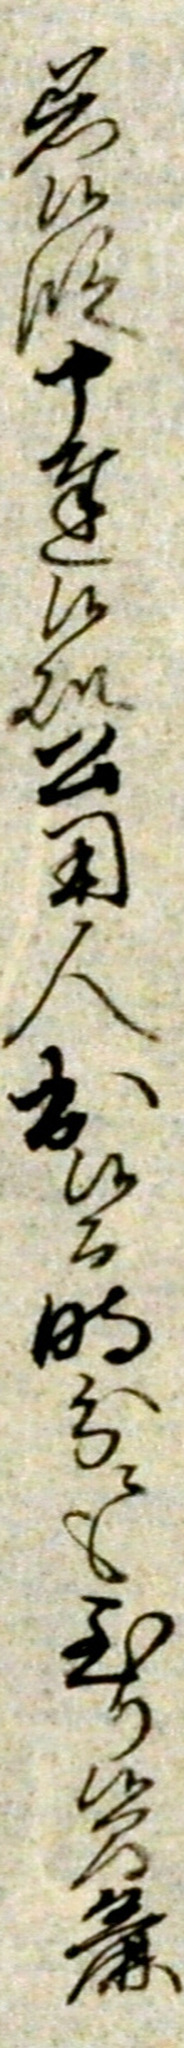着候段申達候処公用人出候而時分ニも至り候間麁
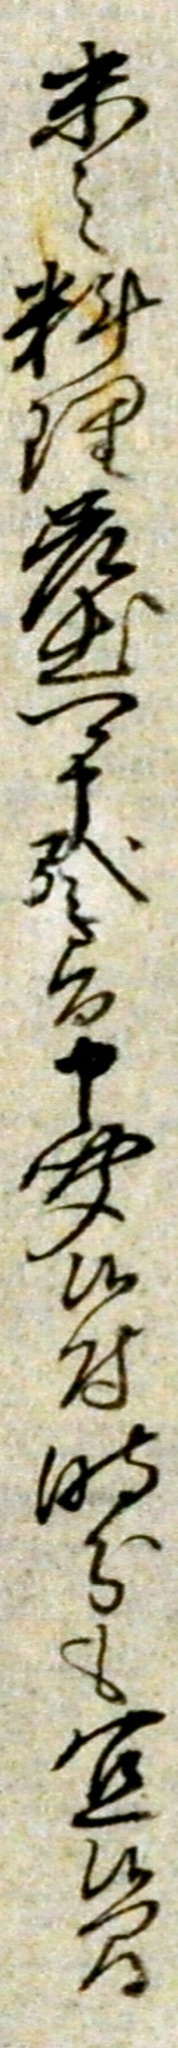末之料理差出可申哉之旨申聞候付時分も宜候間
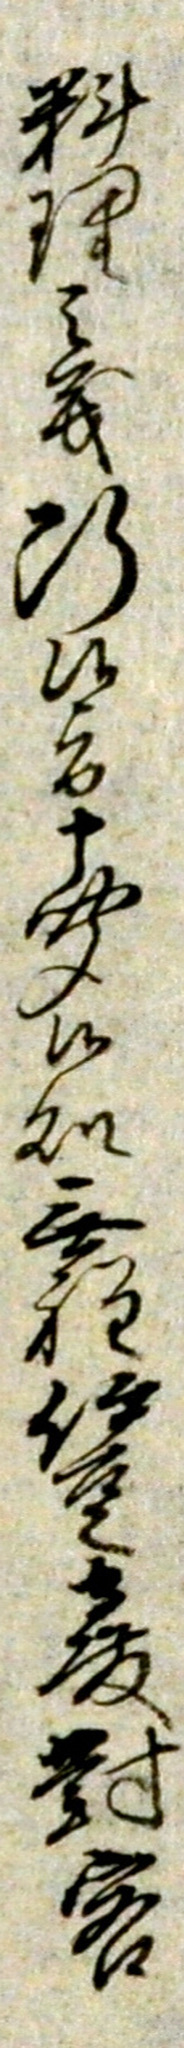料理之義断候旨申聞候処無程伊豆守殿対客
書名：日光御名代相勤候節ノ留
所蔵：伊那市立高遠町図書館・合同会社AMANE
